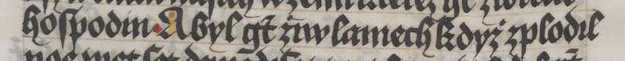hoſpodin. A byl ḡt żiw lamech kdyż zplodil
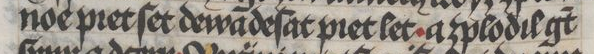noe piet ſet dewadeſat piet let.a zplodil ḡt
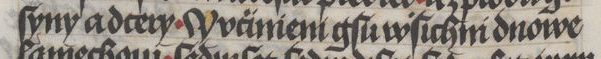ſyny a dcery.Y vċíniení gſu wẛichni dnowe
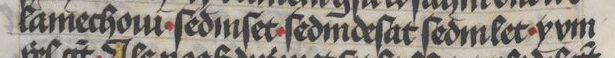lamechoui. ſedmſet.ſedmdeſat ſedm let.y vm¬
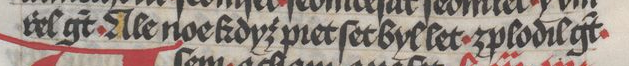ṙel ḡt. Ale noe kdyż piet ſet byl let.zplodil ḡt.
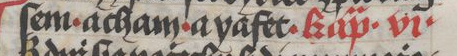ſem.a cham.a yafet. kap.vi.
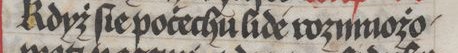Kdyż ſie počechu lidé rozmnożo¬
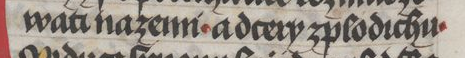wati na zemí.a dcery zplodichu.
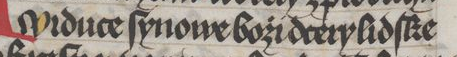Viduce ſynowe bożí dcery lidſke
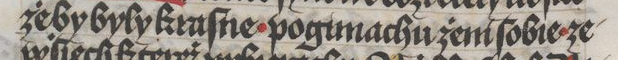że by byly kraſne.pogimachu žení ſobie.ze¬
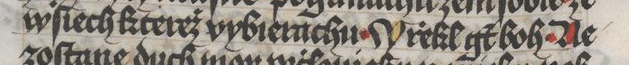wẛiech ktereż vybierachu.Y ṙekl ḡt boh.Ne¬
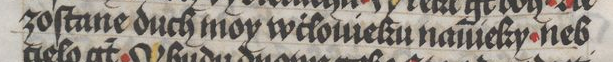zoſtane duch moy w ċlouíeku nauíeky.neb
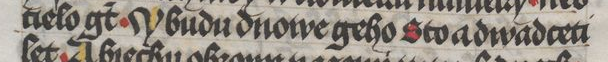cielo ḡt.Y budu dnowe geho Sto a dwadceti
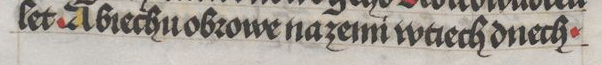let.A biechu obrowe na zemi w tiech dnech.
